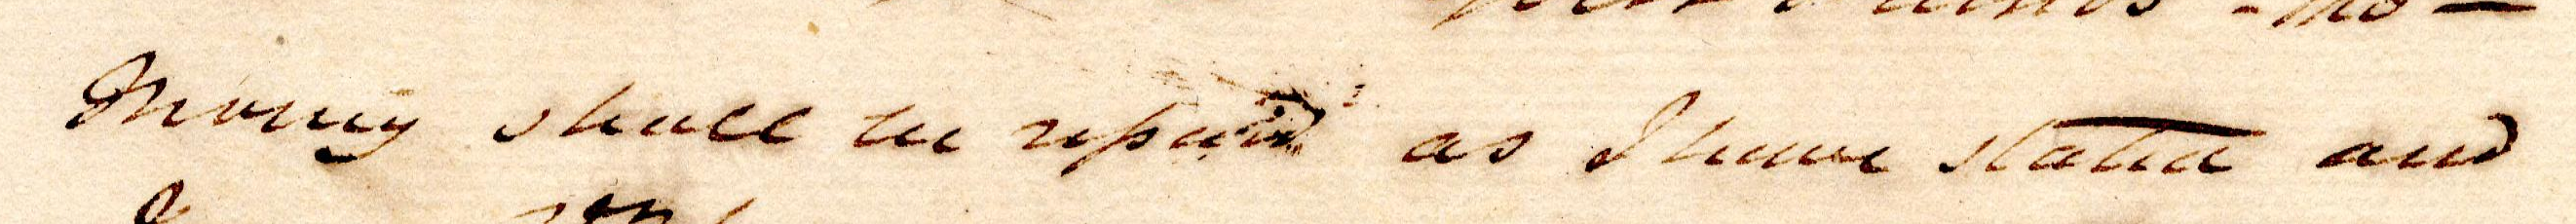Money shall be repaid as I have stated and
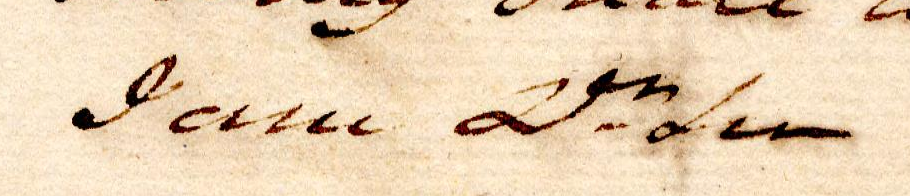I am D^r. Sir
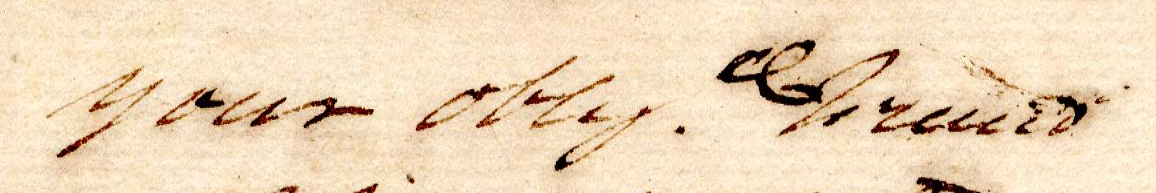your oblig. Freind
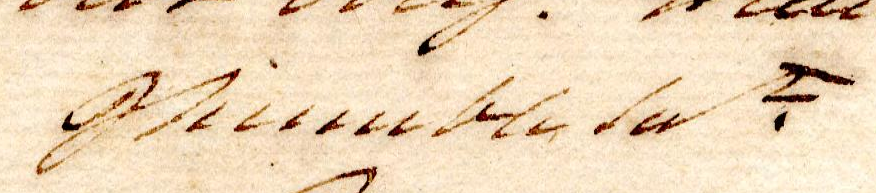& humble Ser^t
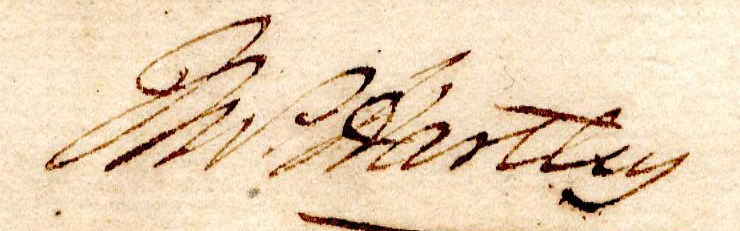Tho^s. Hartley
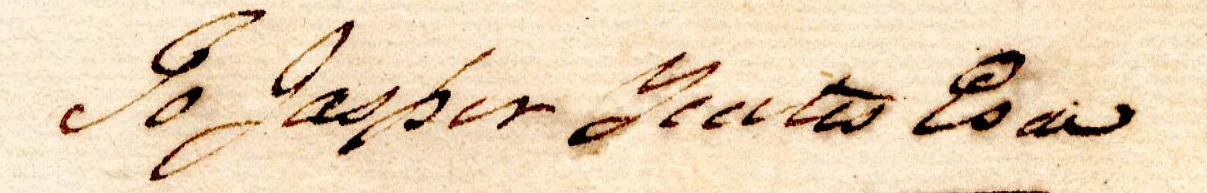To Jasper Yeates Esq
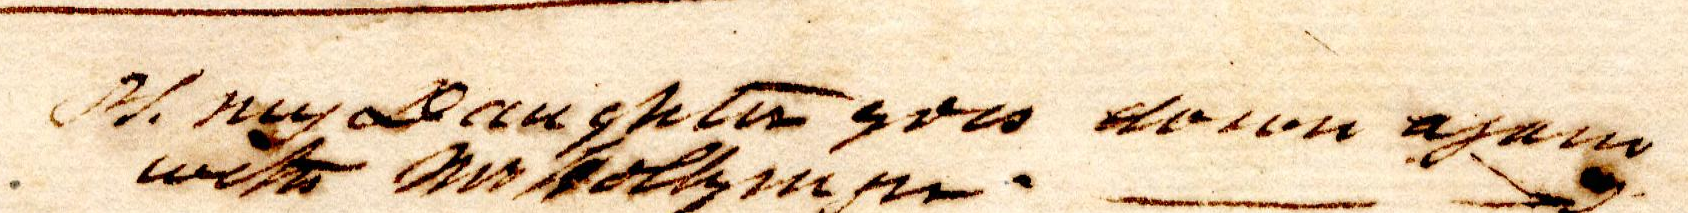PS. my Daughter goes down again
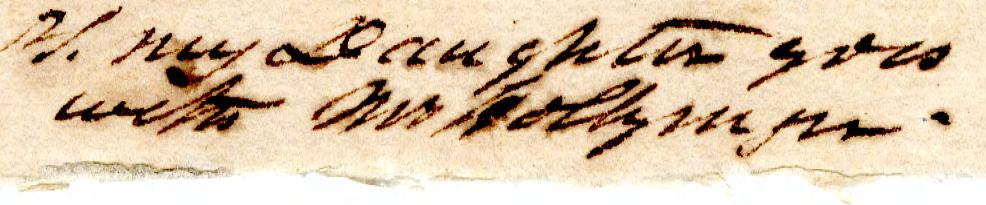with M^r Holzinger
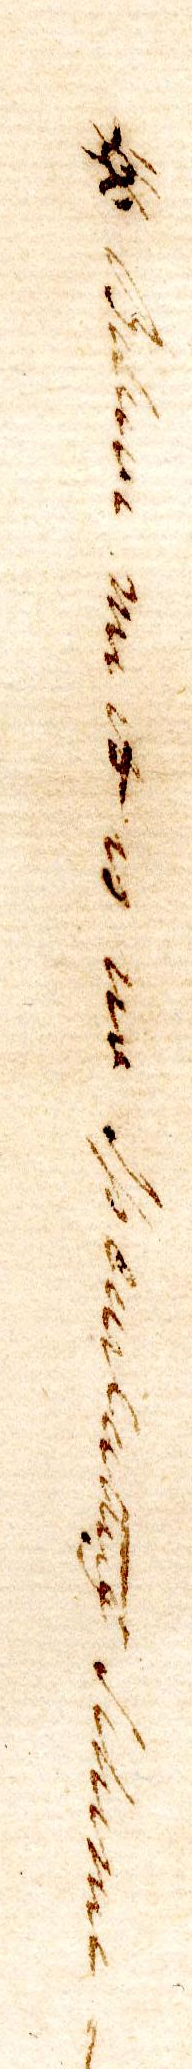for Believe me it is no speculating scheme
